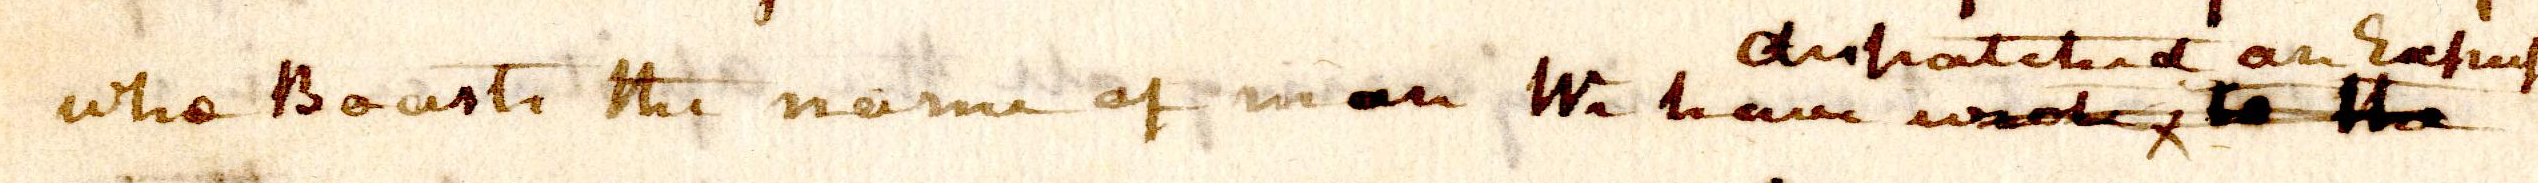who Boasts the name of man We have [wrote to the]
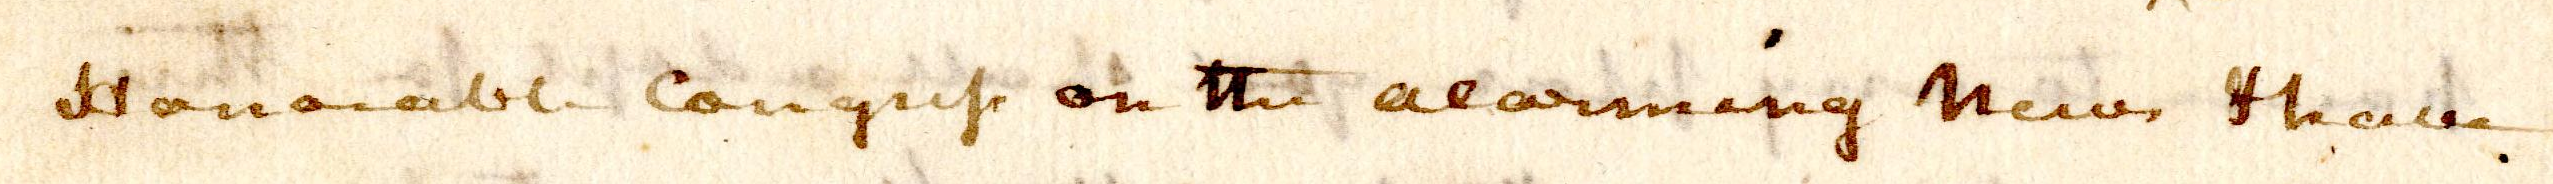Honorable Congress on the alarming News & have
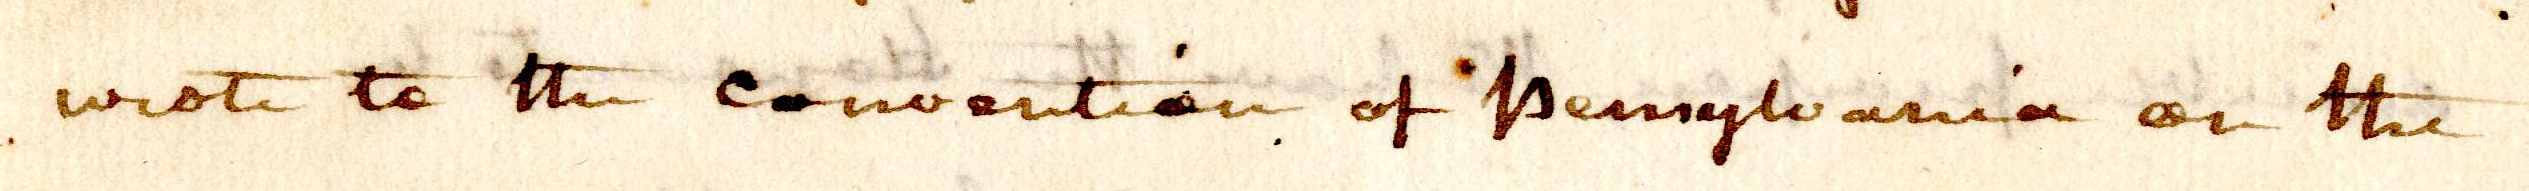wrote to the convention of Pennsylvania on the
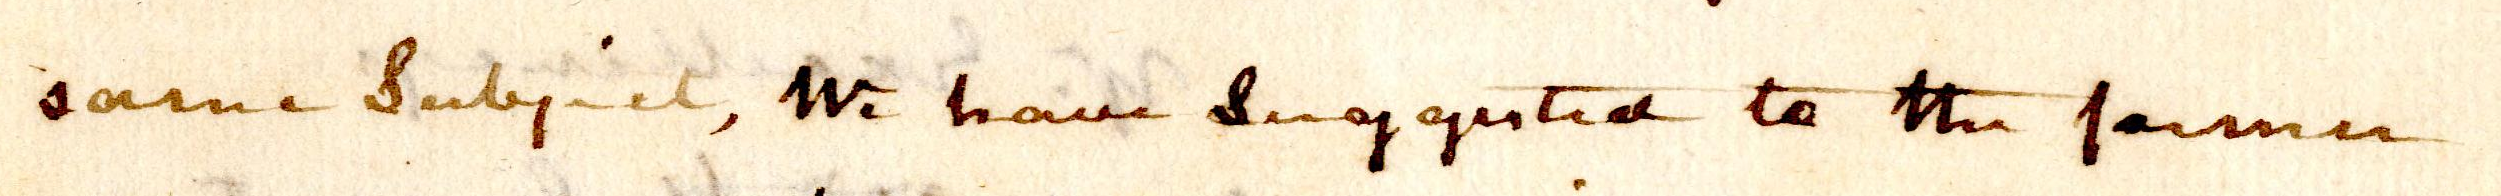same Subject, We have Suggested to the former
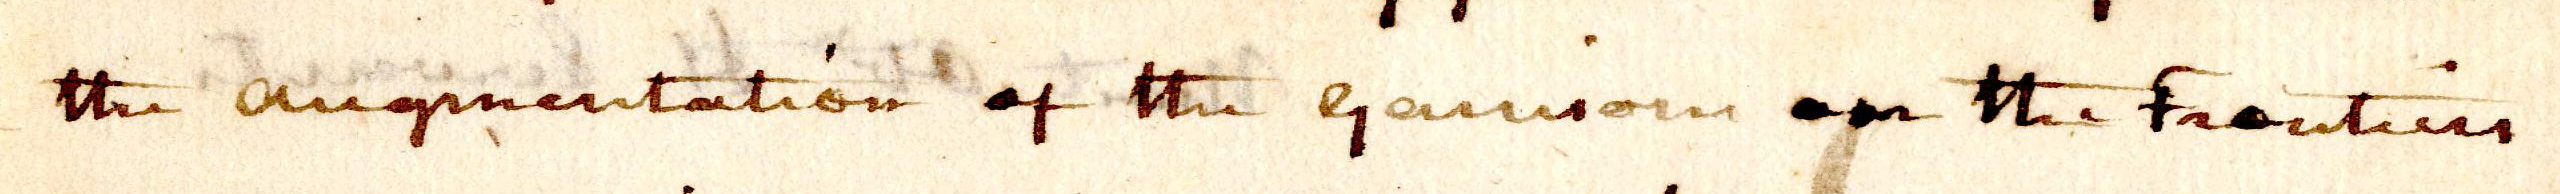the Augmentation of the Garrisons on the Frontiers
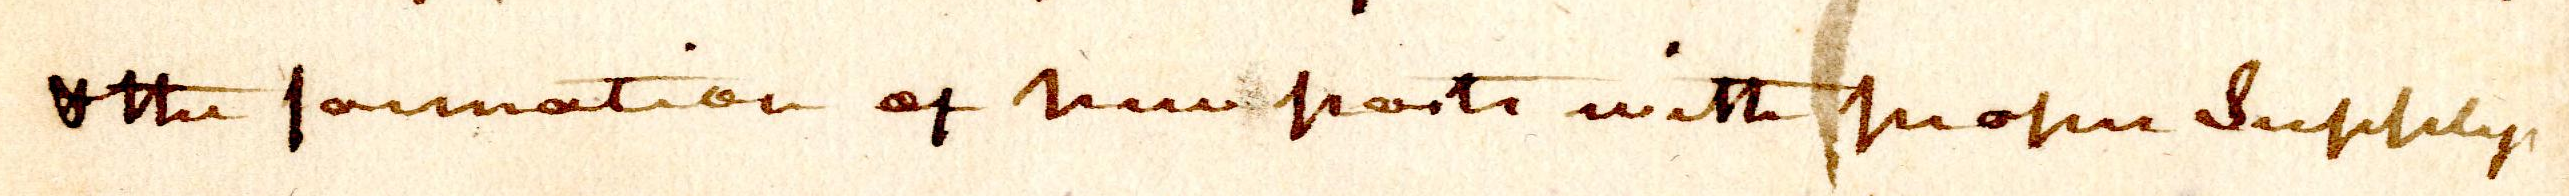& the formation of new posts with proper Supply
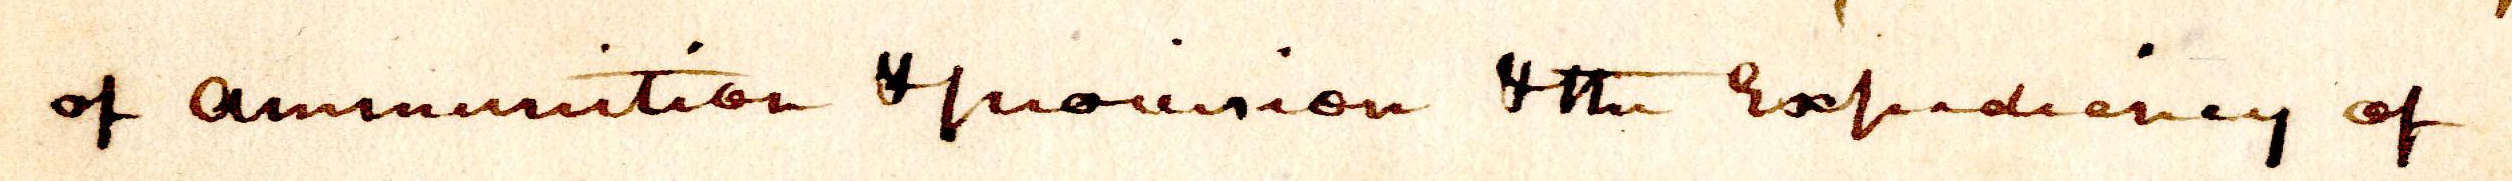of Ammunition & provision & the Expediency of
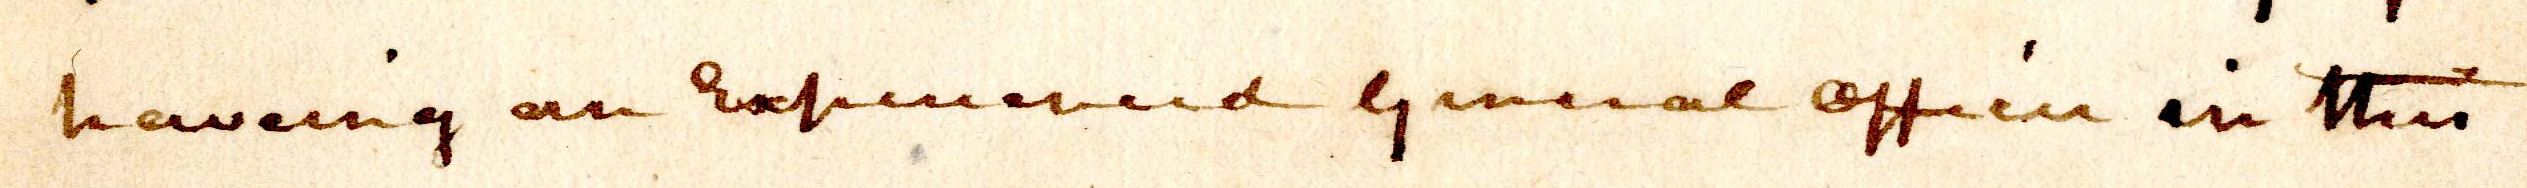haveing an Experienced General Officer in this
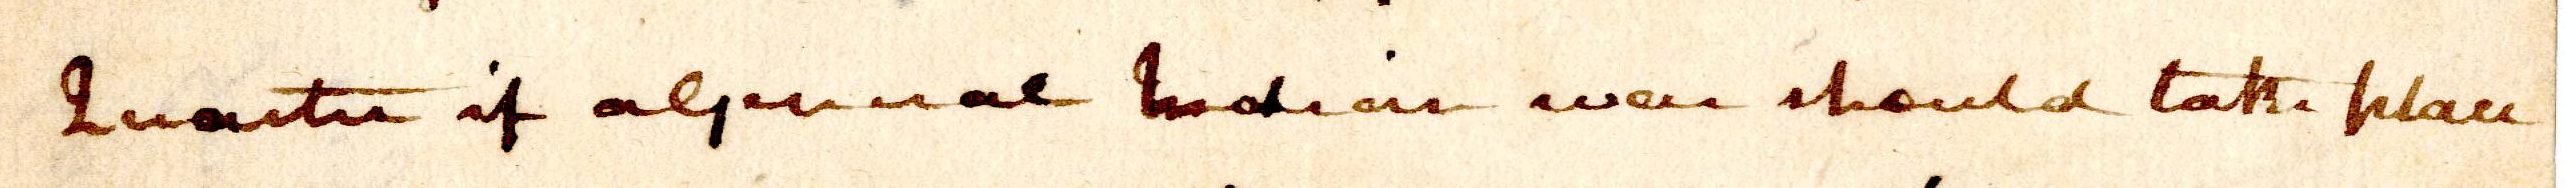Quarter if a General Indian war should take place
